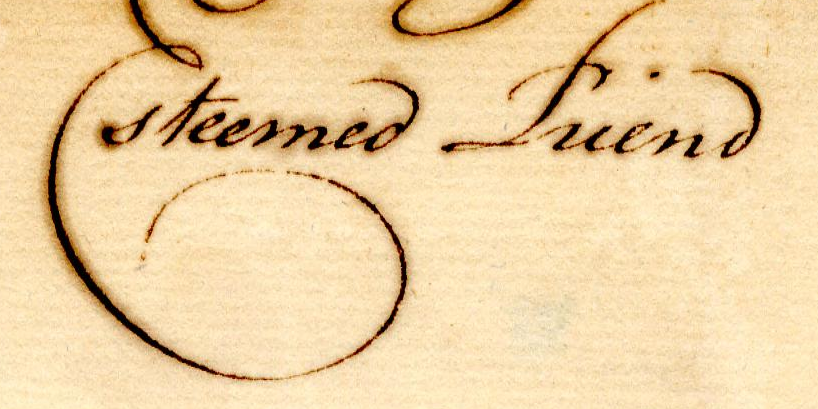Esteemed Friend
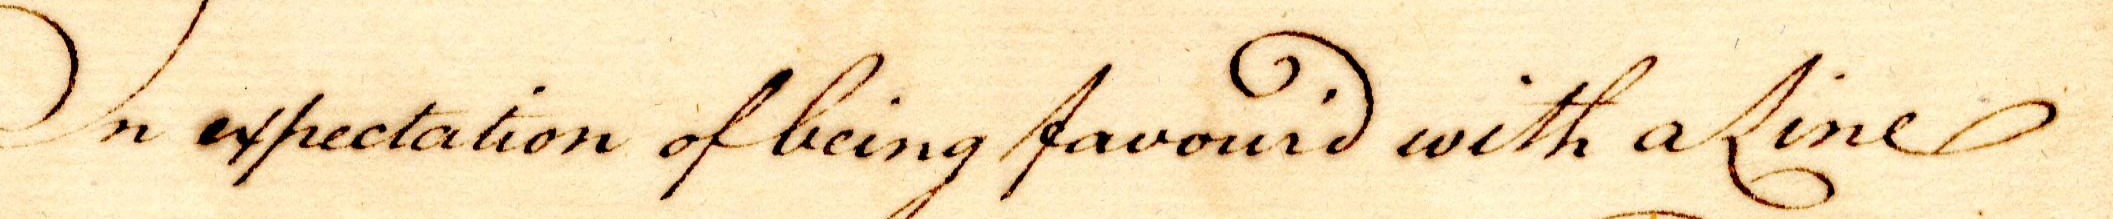In expectation of being favour'd with a Line
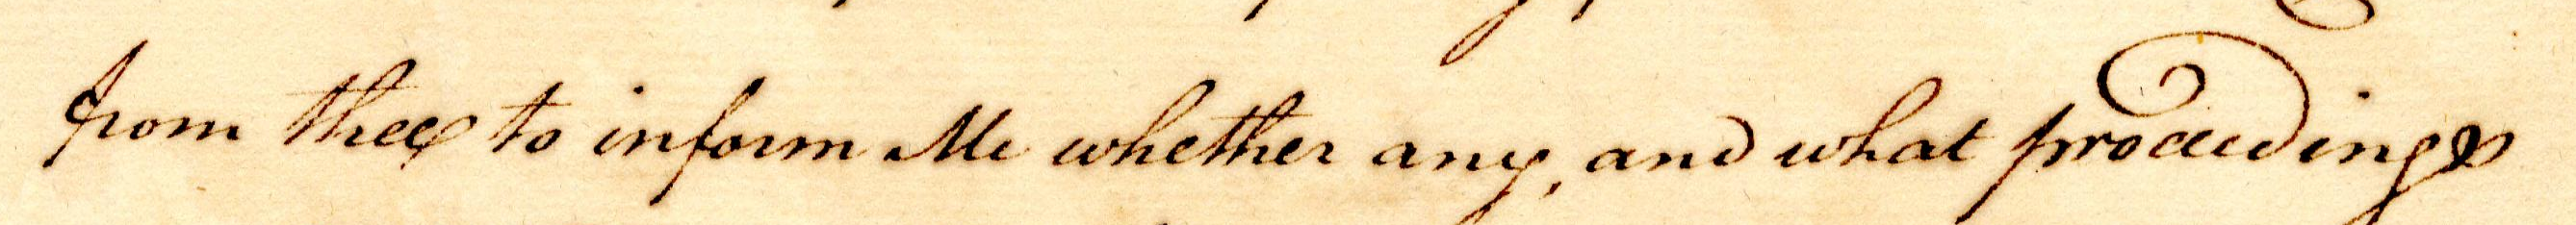from thee to inform Me whether any and what proceedings
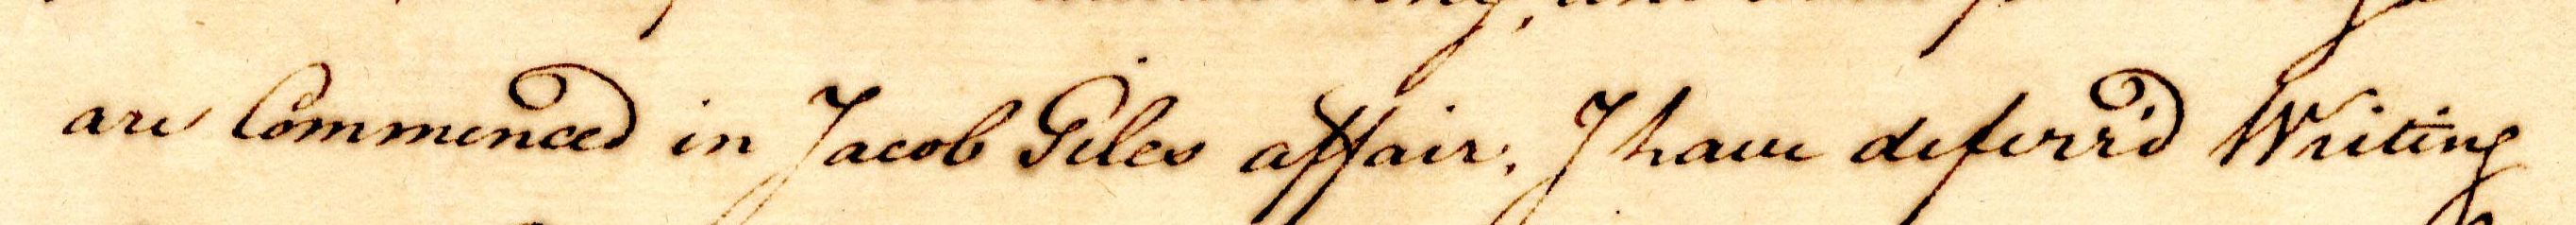are Commenced in Jacob Giles affair. I have deferr'd Writing
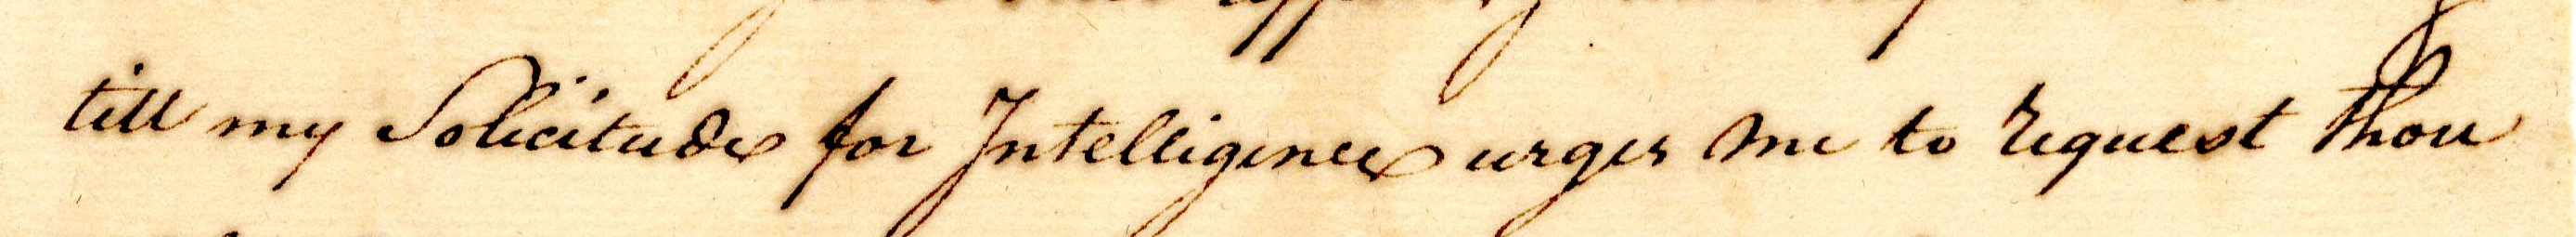till my Solicitude for Intelligence urges me to request thou
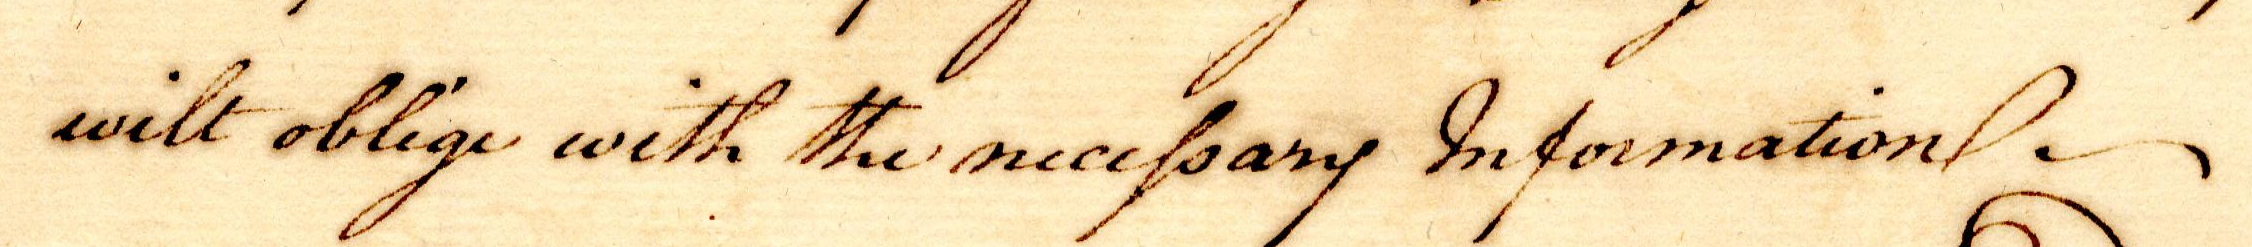wilt oblige with the necessary Information.
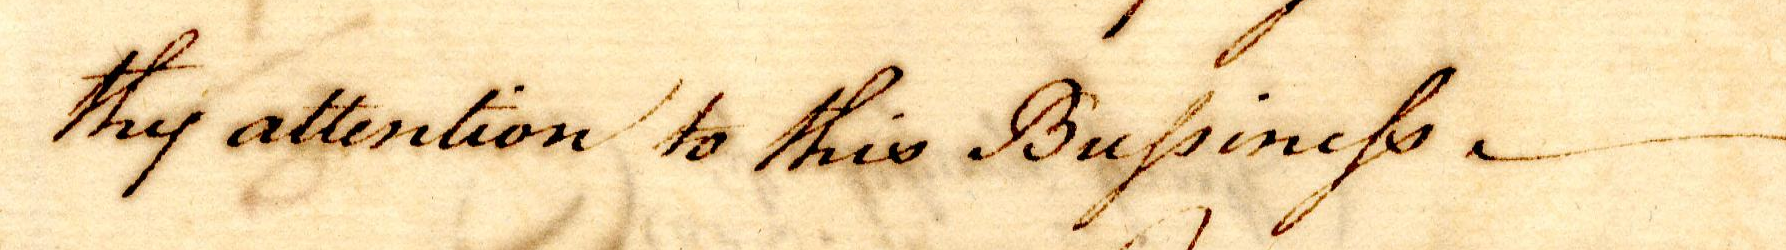thy attention to this Business-
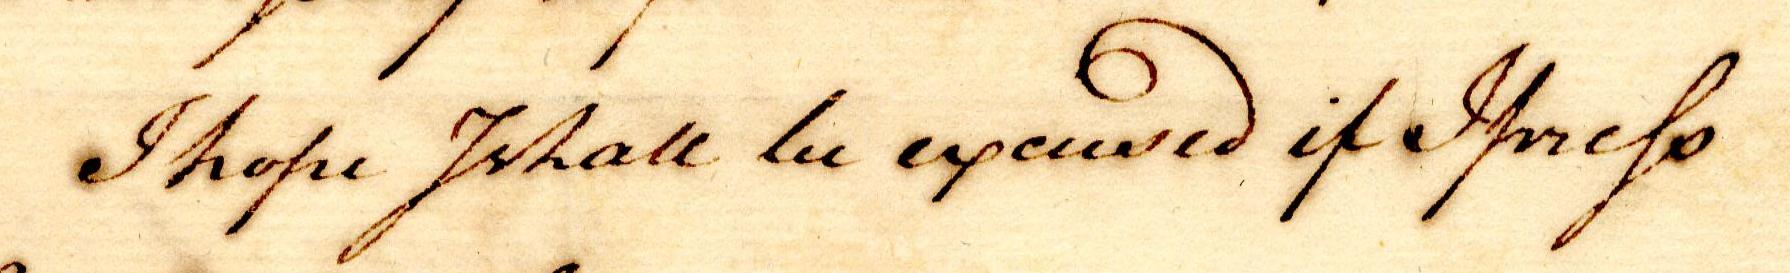I hope shall be excused if I press
